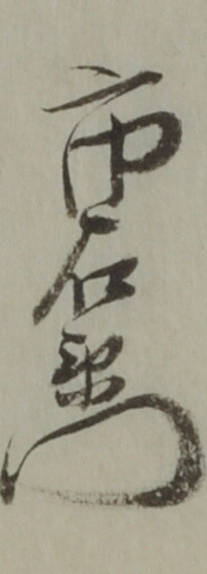半右衛門
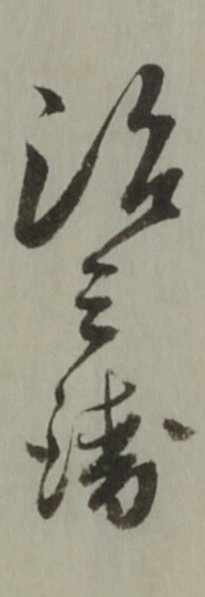治兵衛
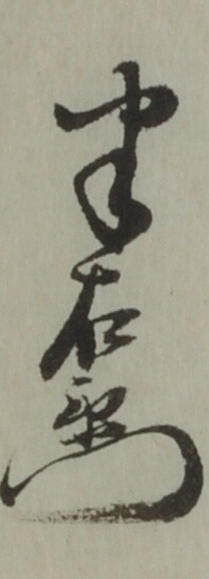半右衛門
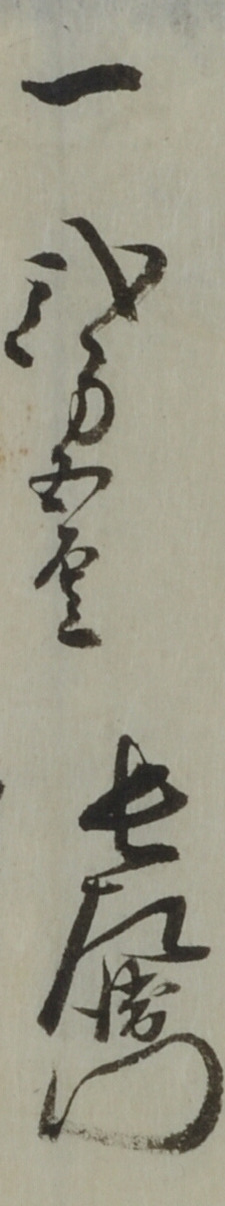一弐分五厘長左衛門
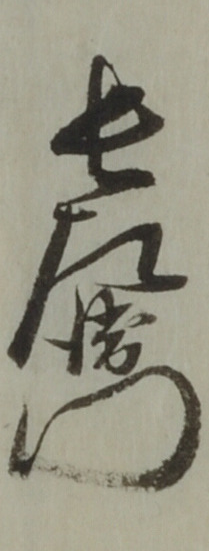甚左衛門
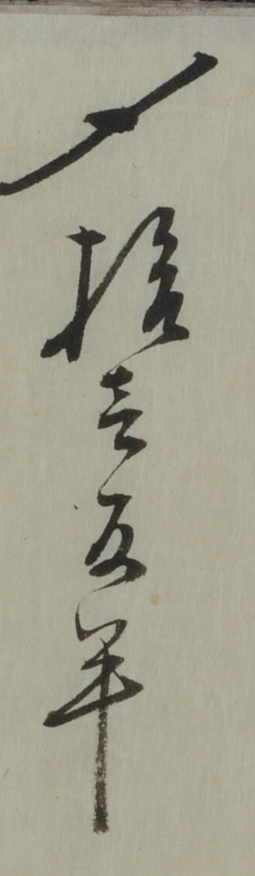〆拾壱反半

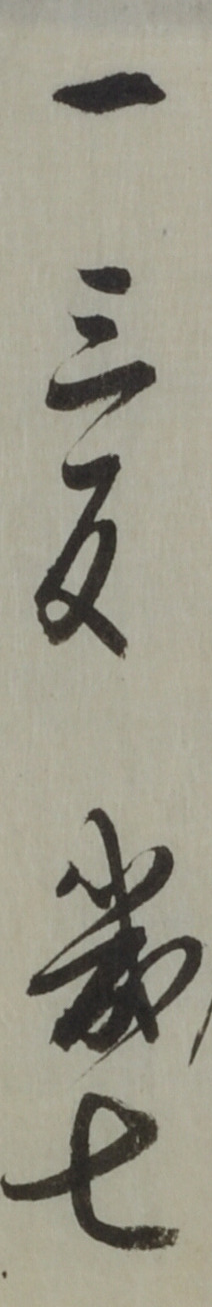一三反幾七
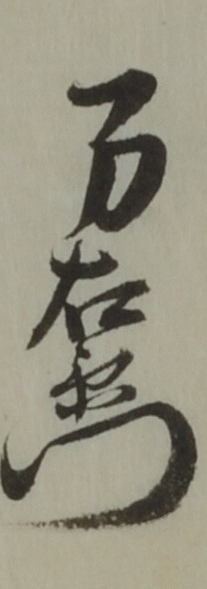万右衛門
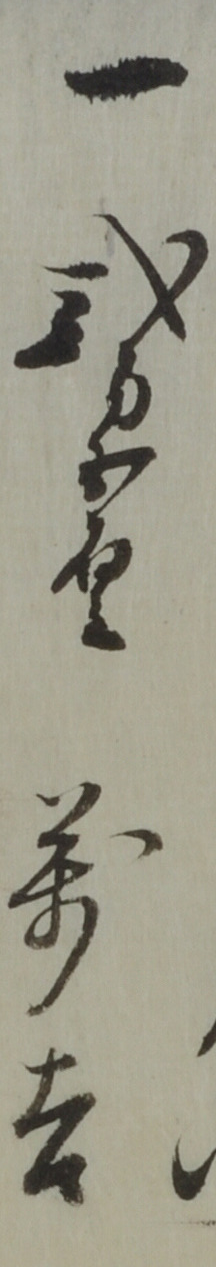一弐分五厘万吉
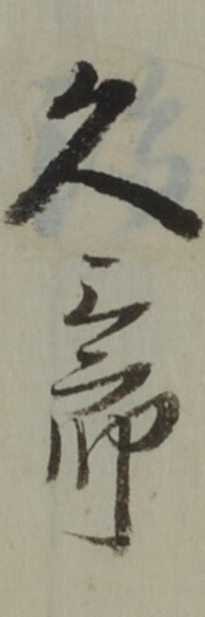久三郎
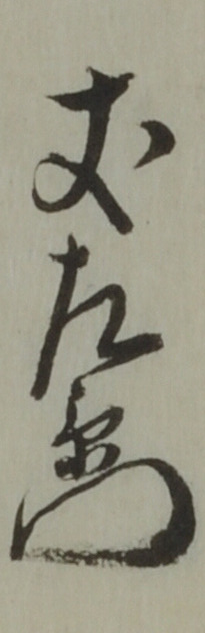丈左衛門

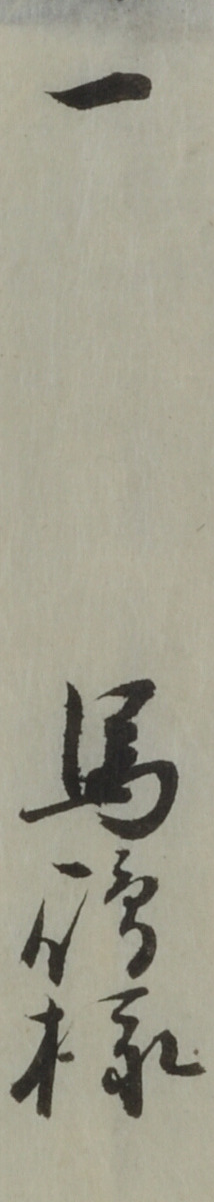一馬島様
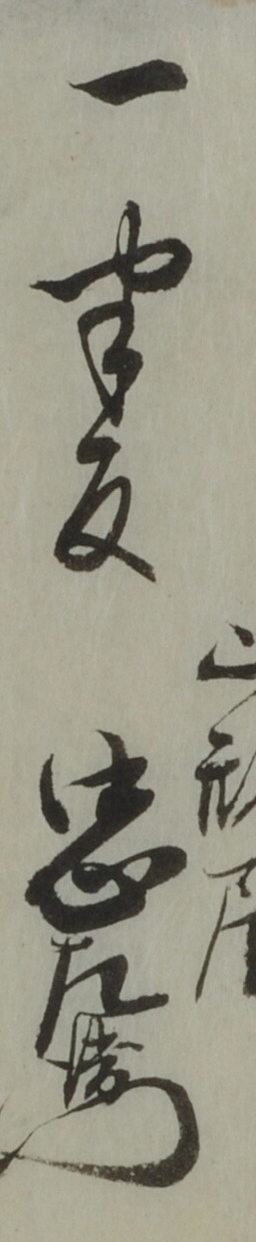一半反忠左衛門
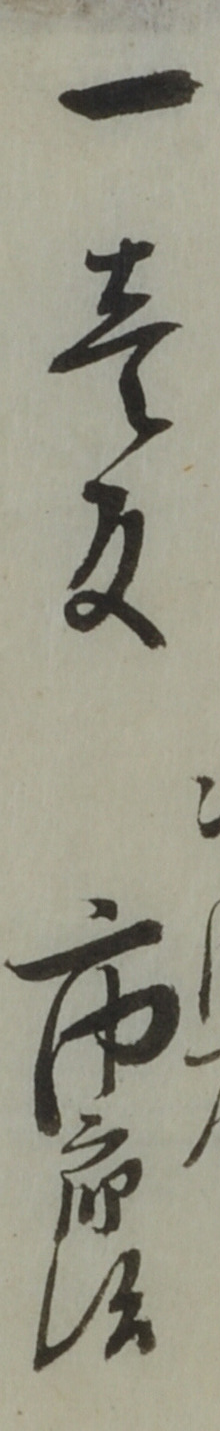一壱反市郎治
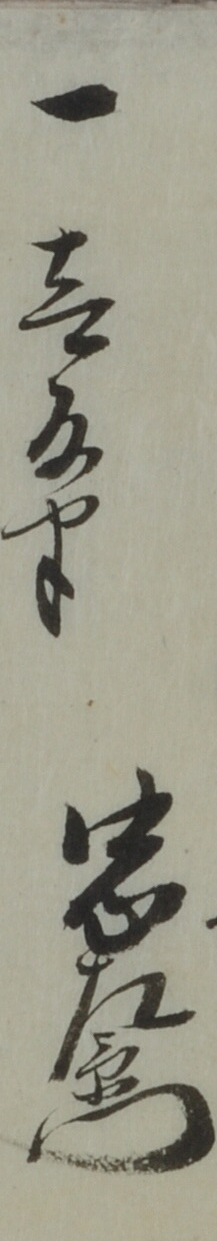一壱反半忠左衛門
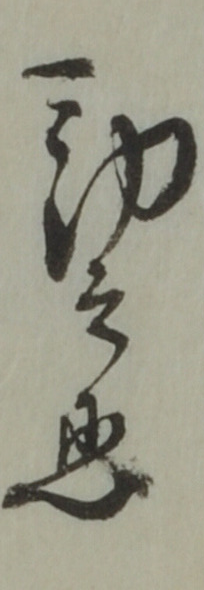勘兵衛
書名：融通割合帳
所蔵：伊那市立高遠町図書館・合同会社AMANE
